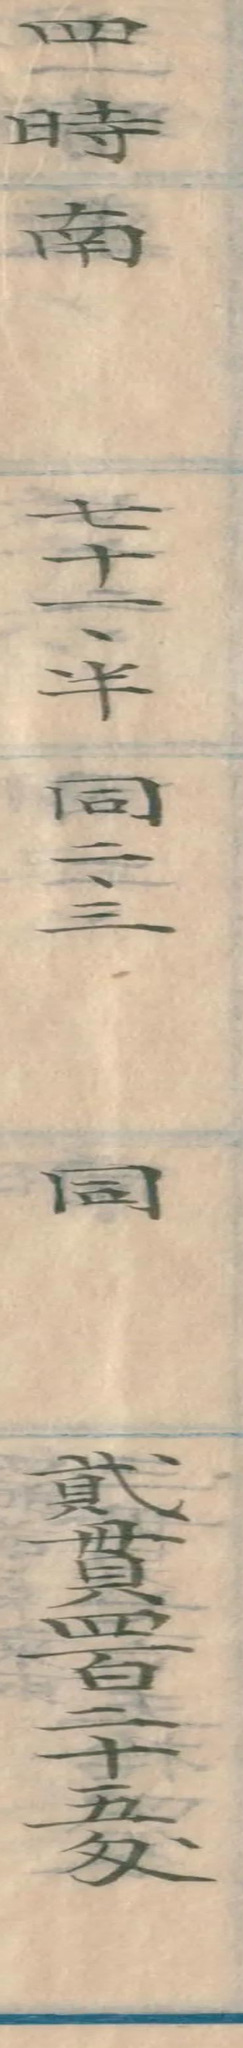四時南七十一ヽ半同二ヽ三同弐貫四二十五匁
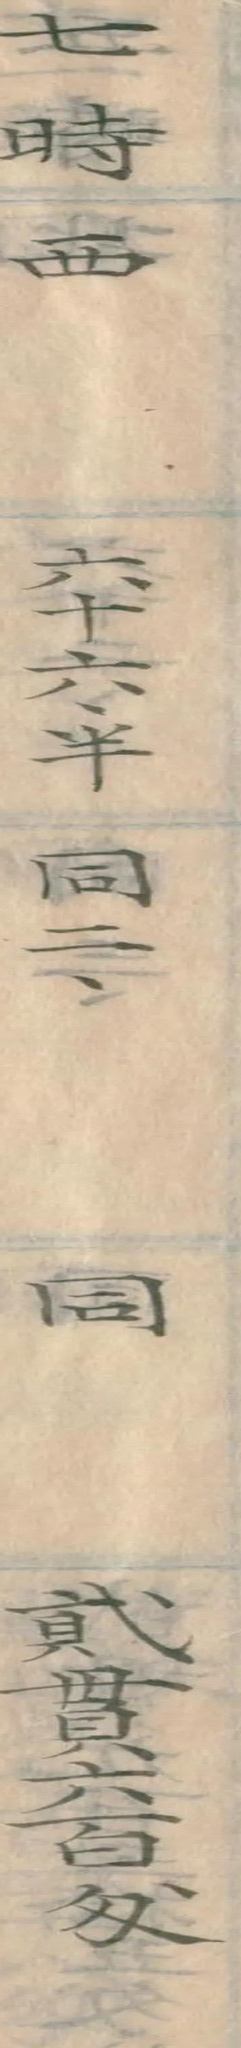七時西六十六ヽ半同二ヽ同弐貫六百匁

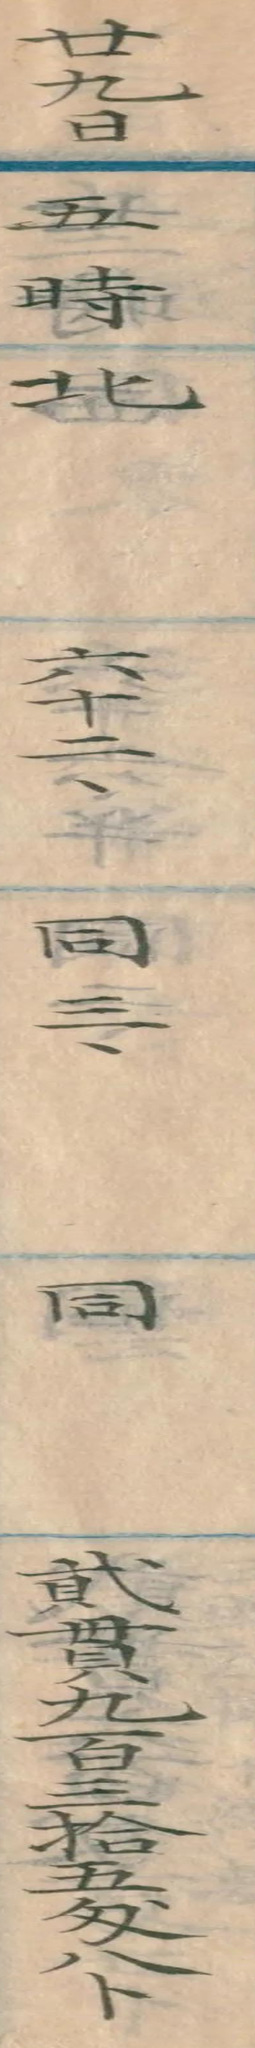廿九日五時北六十二ヽ同三ヽ同弐貫九百三拾五匁八分
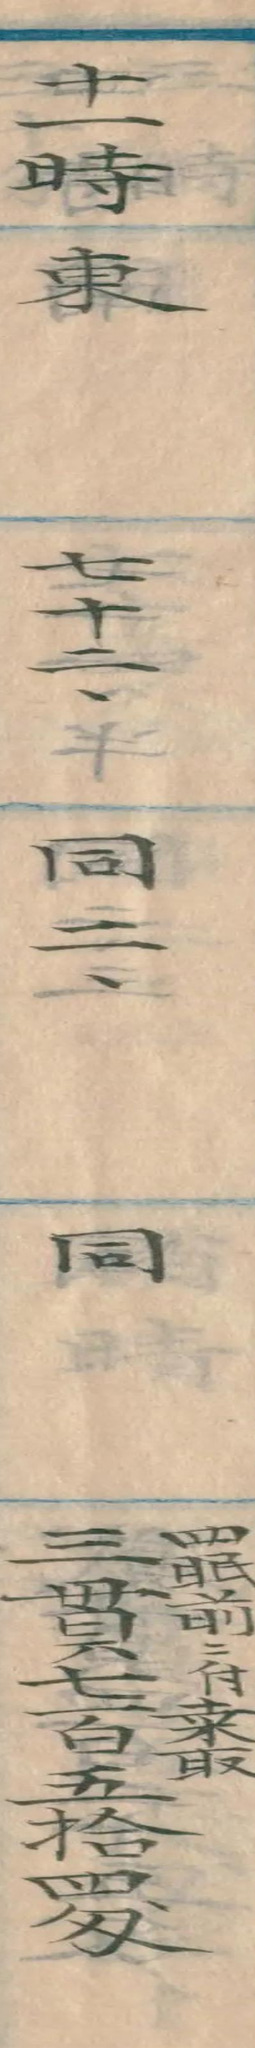十一時東七十二ヽ同二ヽ同三貫七百五拾四匁
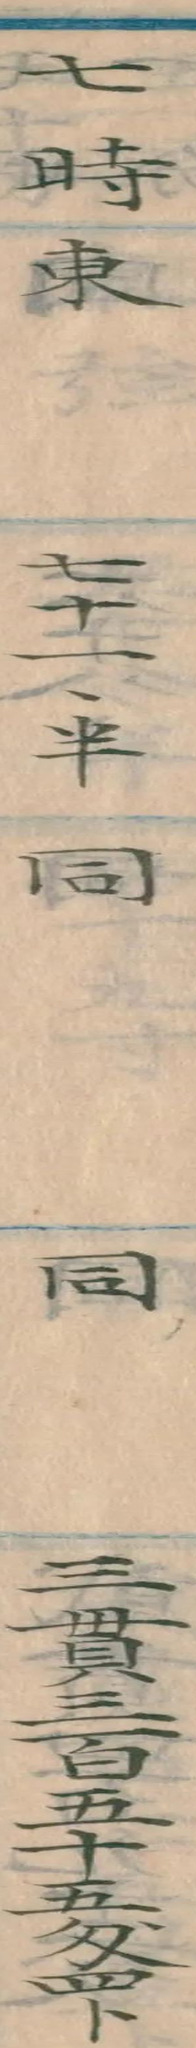七時東七十一ヽ半同同三貫三百五十五匁四分
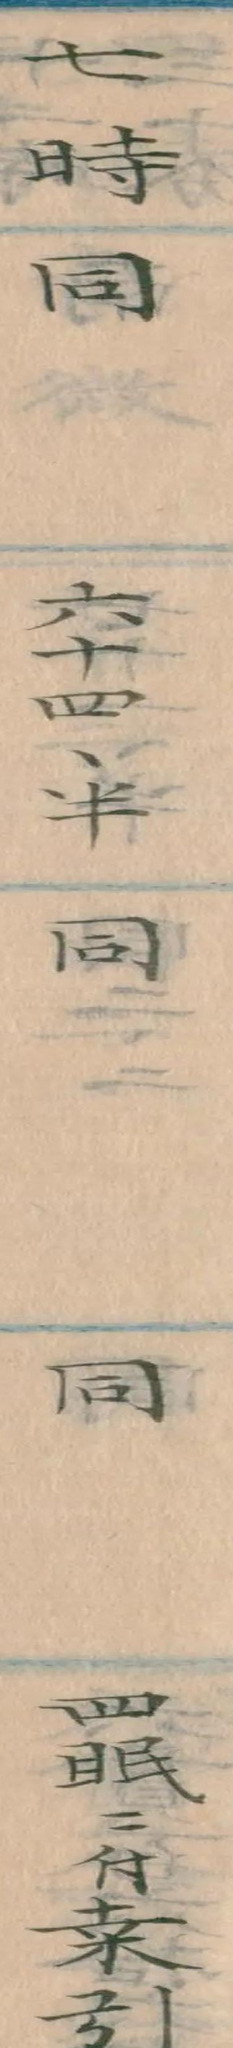七時同六十四ヽ半同同四眠ニ付桑引
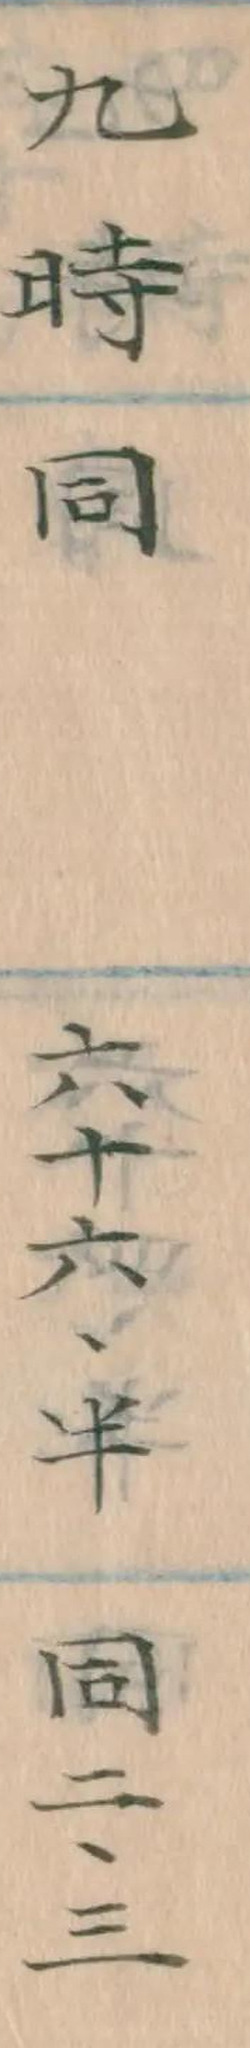九時同六十六ヽ半同二ヽ三同同
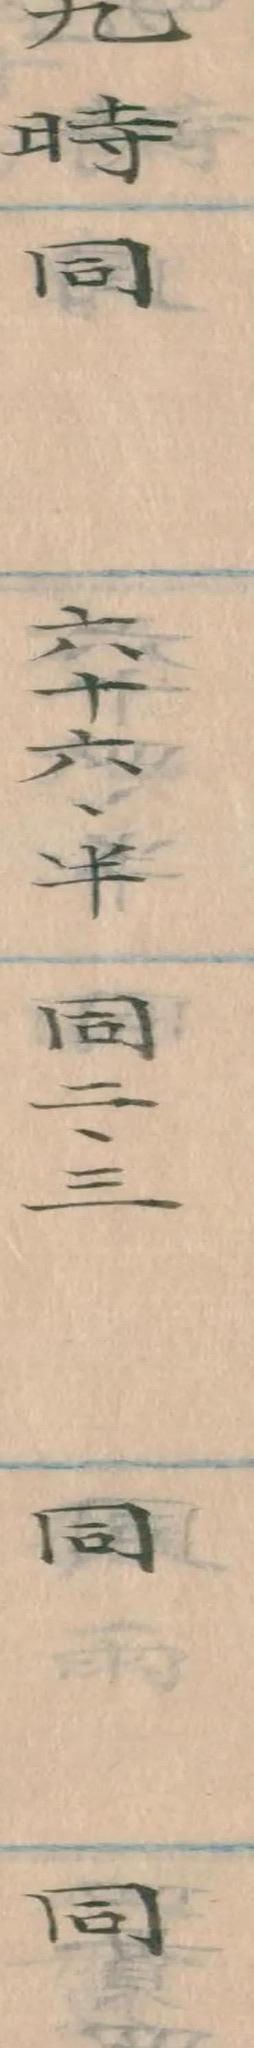九時同六十六ヽ半同二ヽ三同同
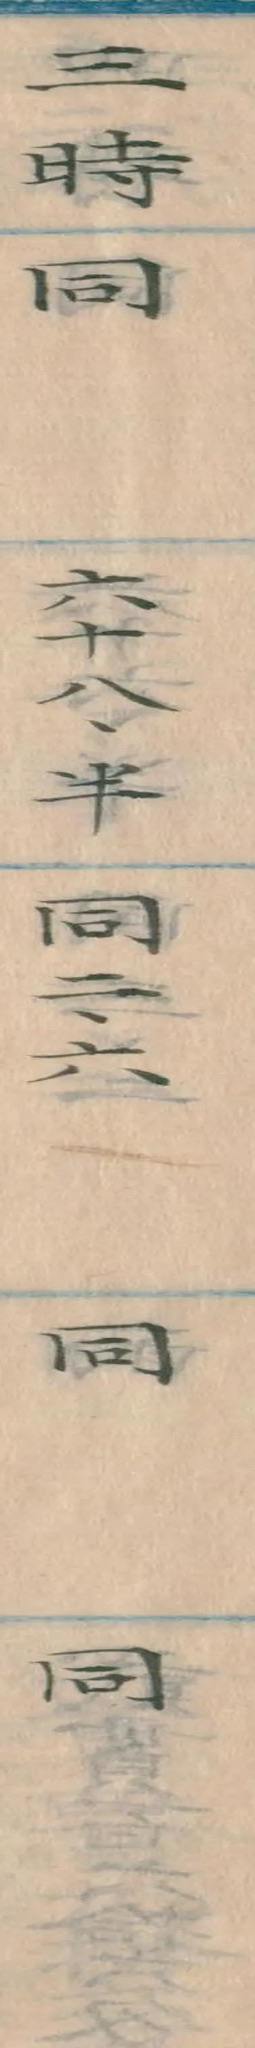三時同六十八ヽ半同二ヽ六同同
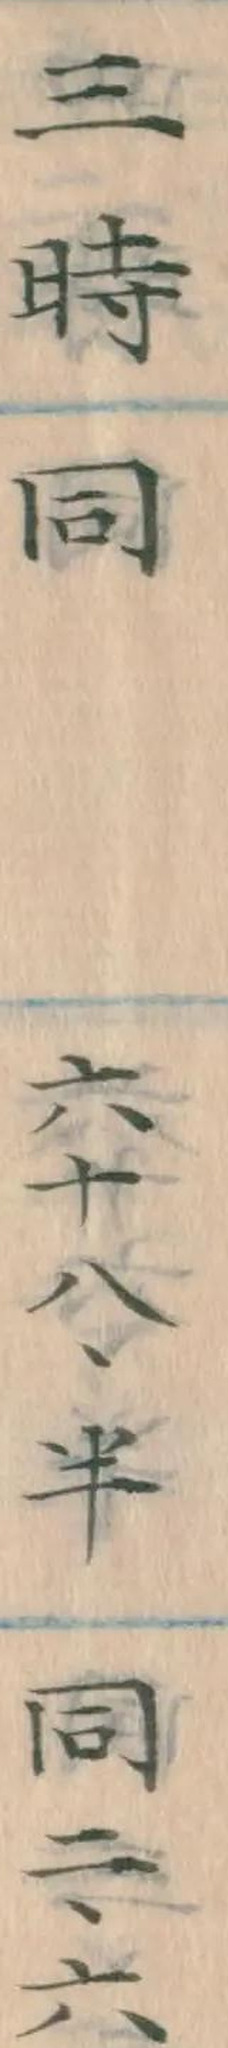三時同六十八ヽ半同二ヽ六同同
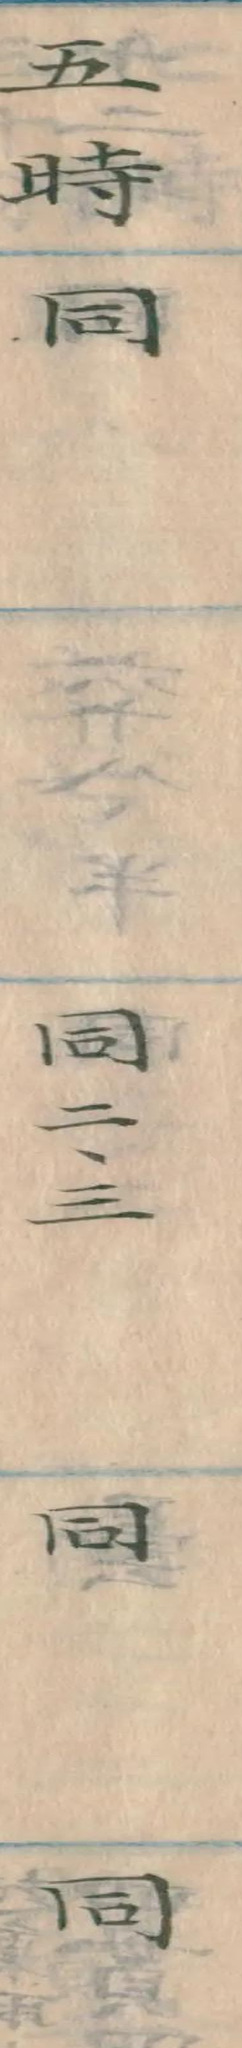五時同同二ヽ三同同
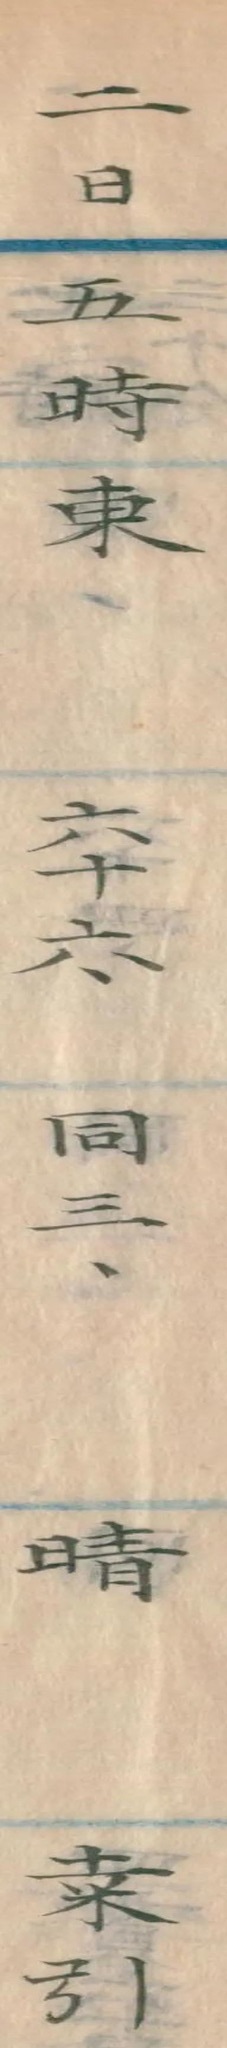二日五時東六十八ヽ同三ヽ晴桑引
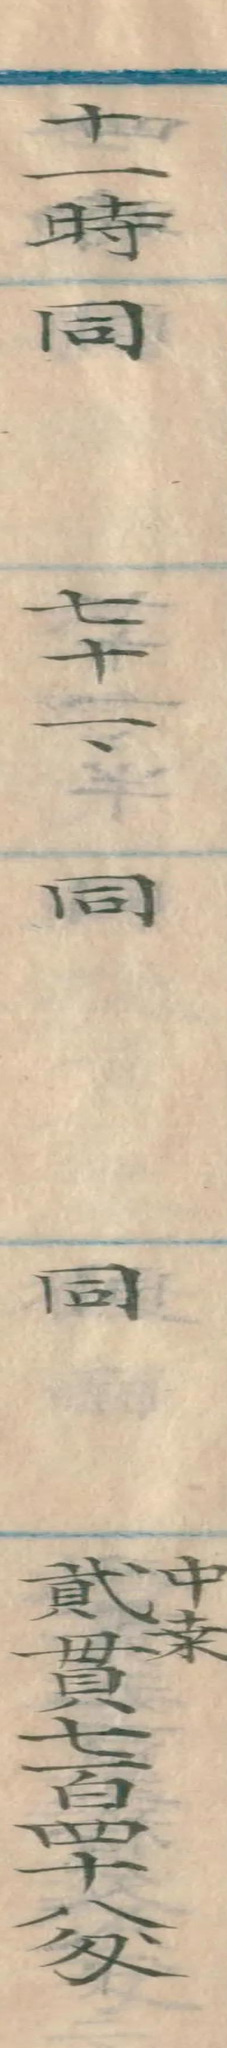十一時同七十一ヽ同同弐貫七百四十八匁
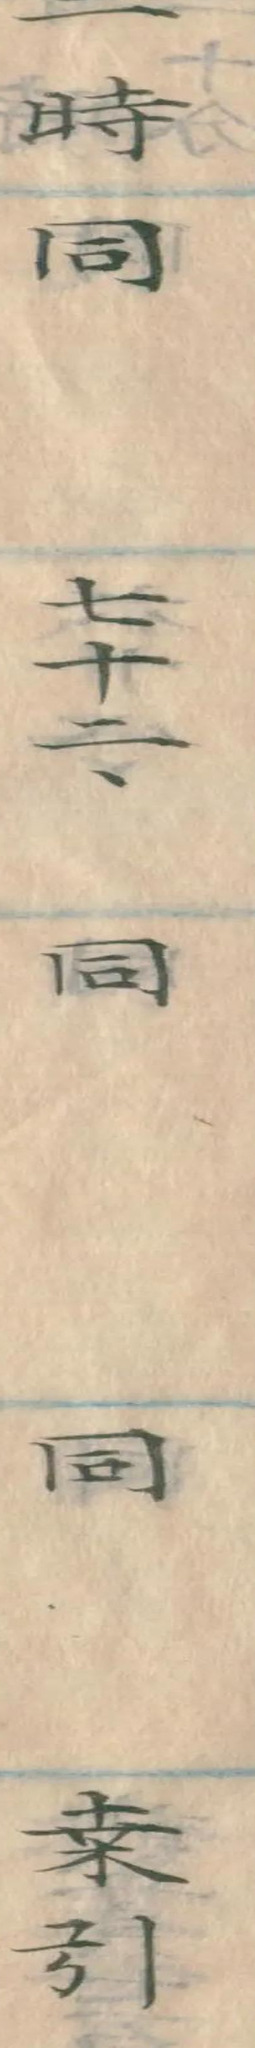三時同七十二ヽ同同桑引

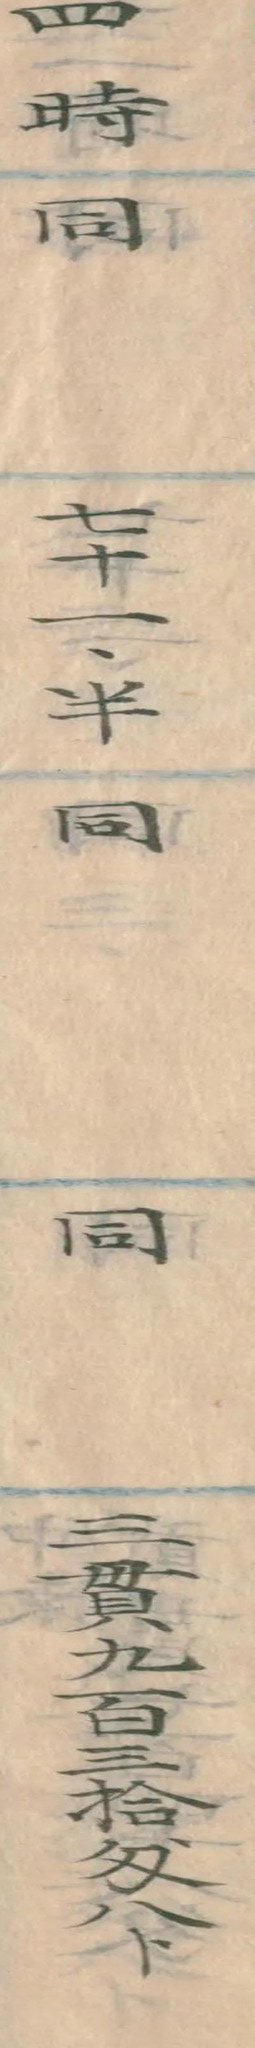四時同七十一ヽ半同同三貫九百三拾匁八分
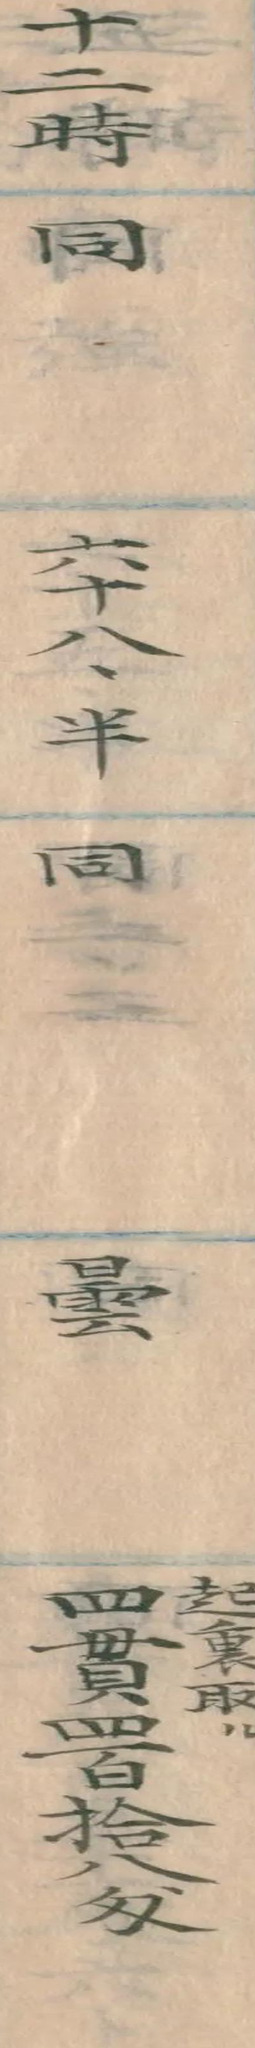十二時同六十八ヽ半同曇四貫四百拾八匁
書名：蚕桑集成
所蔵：国立国会図書館 National Diet Library, JAPAN
